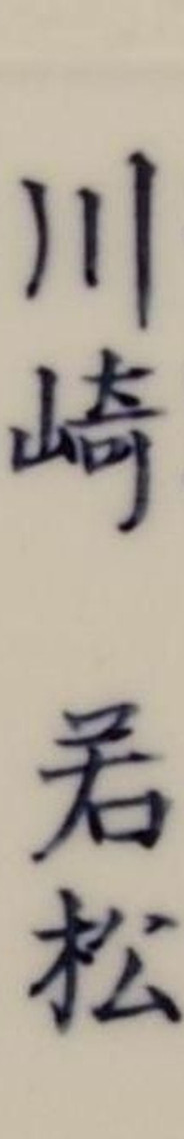川崎若松
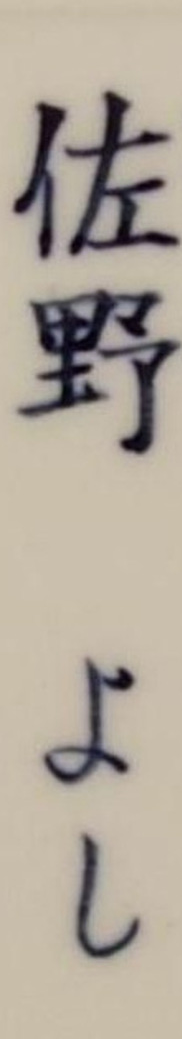佐野よし
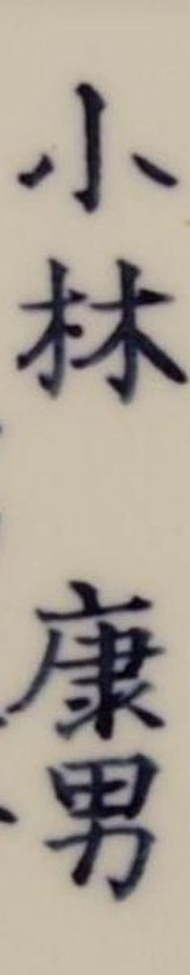小林康男
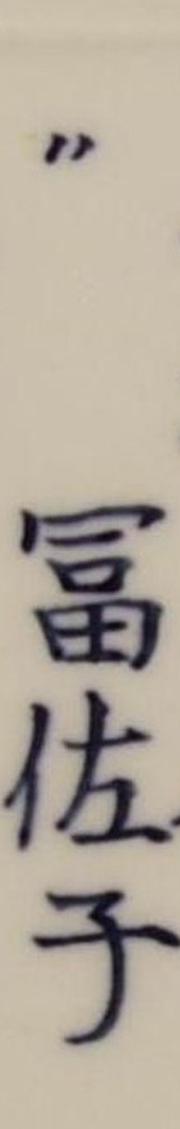冨佐子
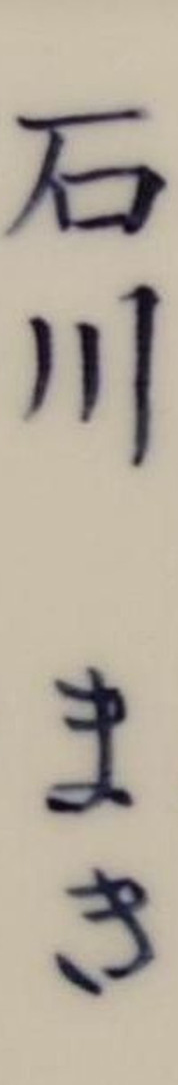石川まき
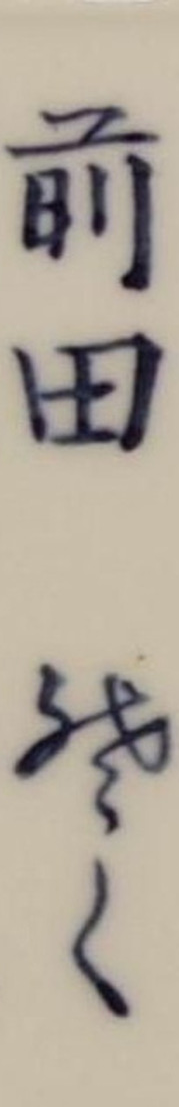前田そく
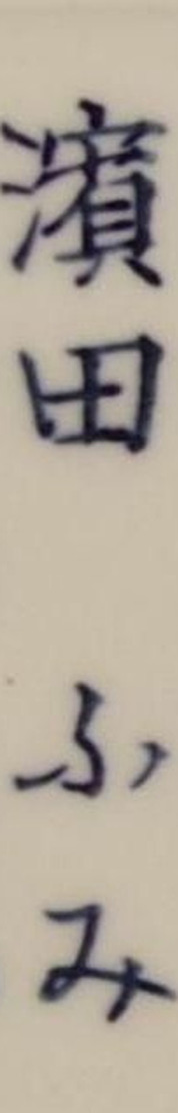浜田ふみ
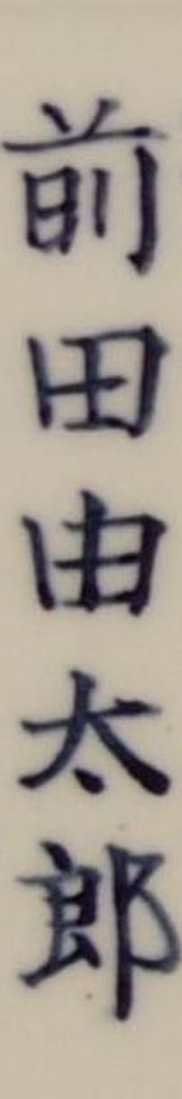前田由太郎
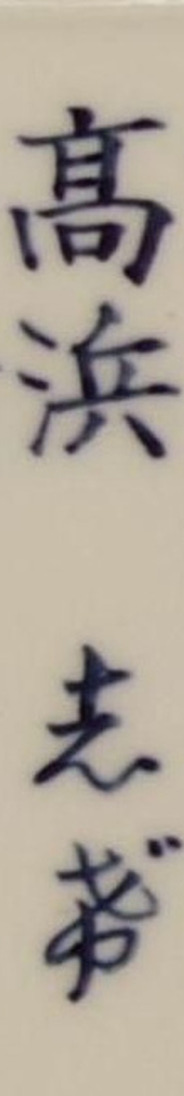高兵しげ
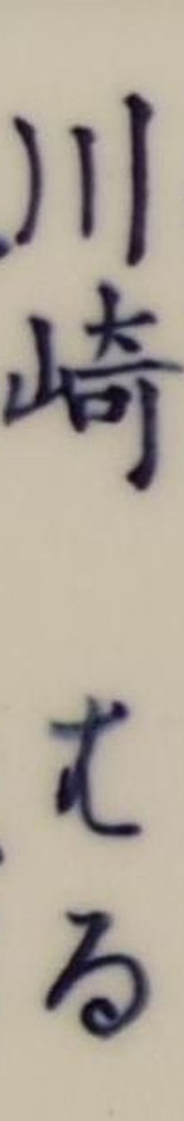川崎はる
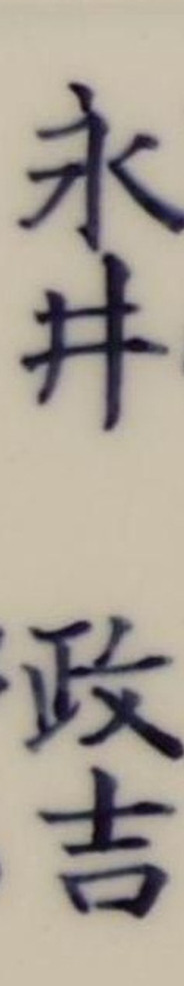永井政吉

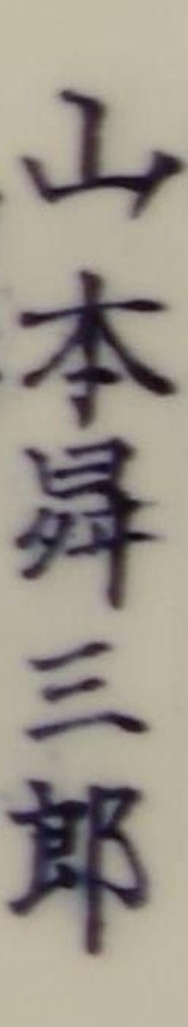山本昇三郎
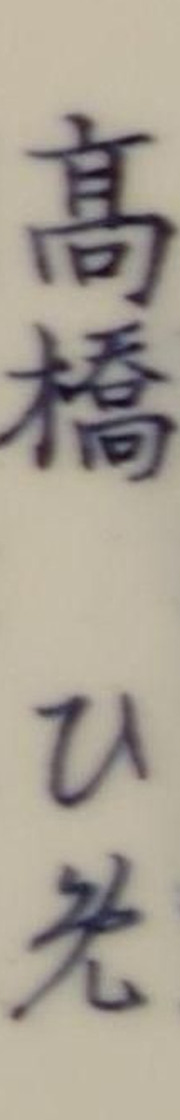高橋ひめ
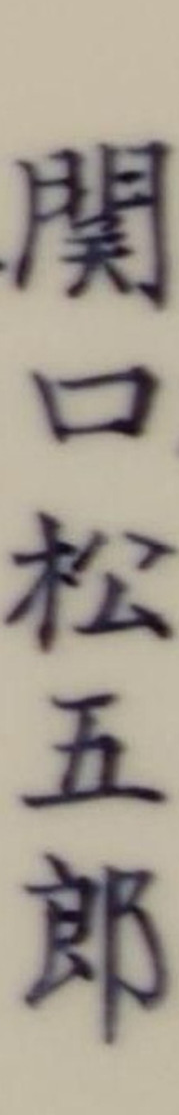関口松五郎
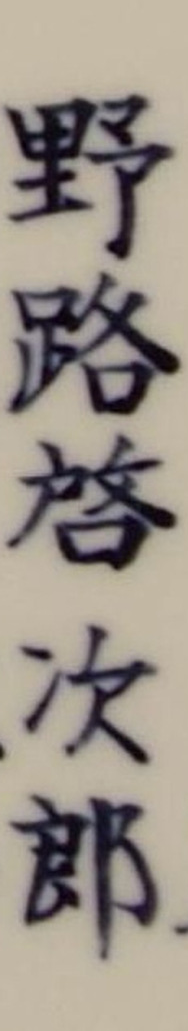野路啓次郎
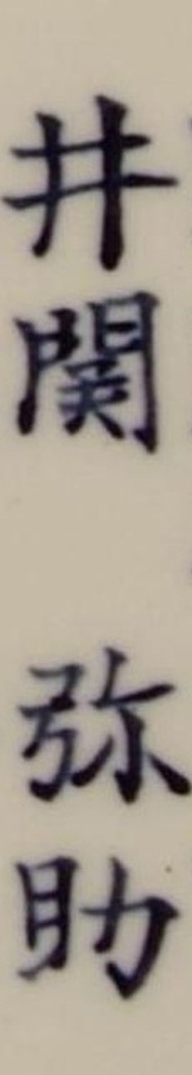井関弥助
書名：E~L
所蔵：高野山金剛峯寺
